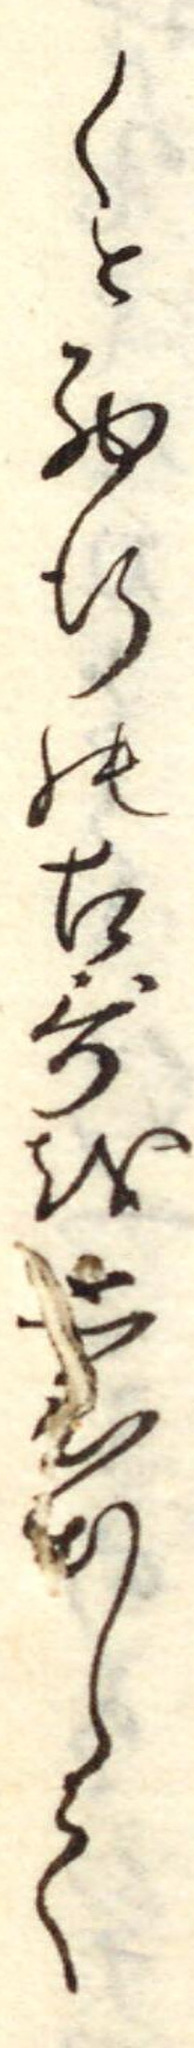くと西行の古哥を思ひ出して
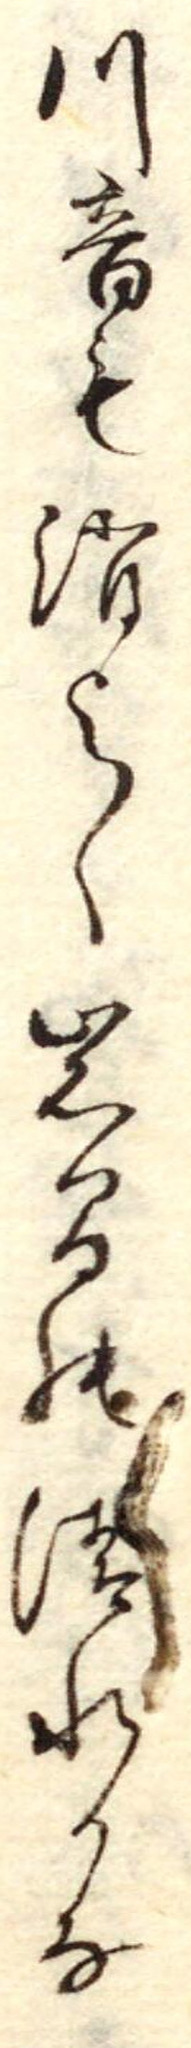川音も消えて岩間の清水かな
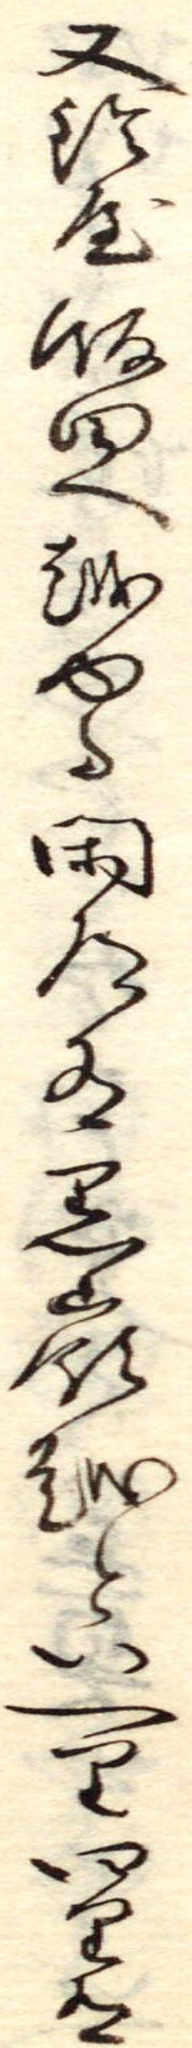又鈴屋飯田へ越ゆる閑道有黒嶺越といへり四里有
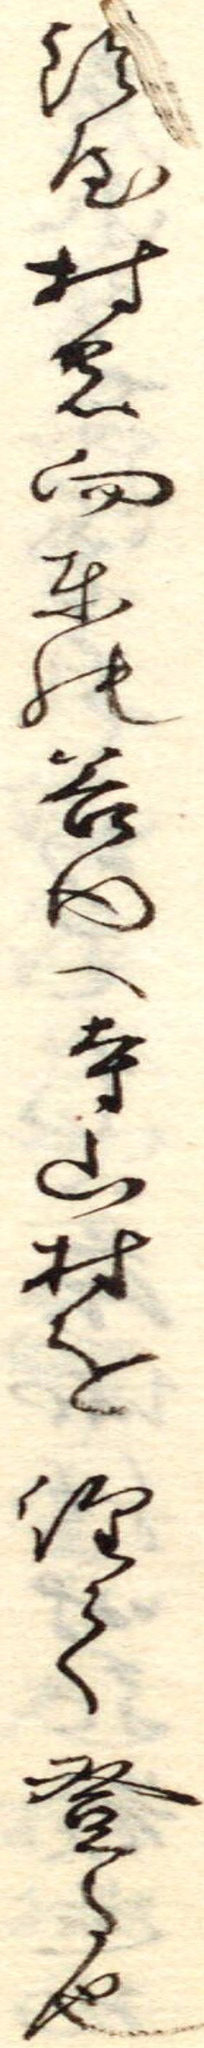鈴屋村の向東の谷内へ寺山村を経て登る也
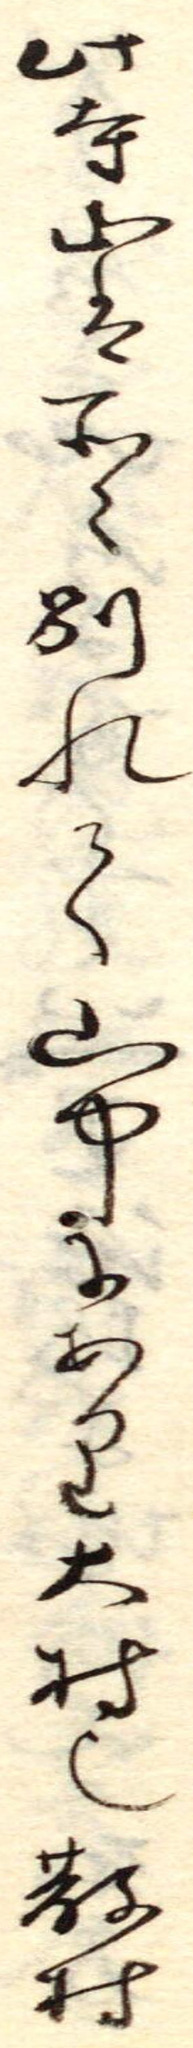此寺山は所々別れて山中にあり大村也散村
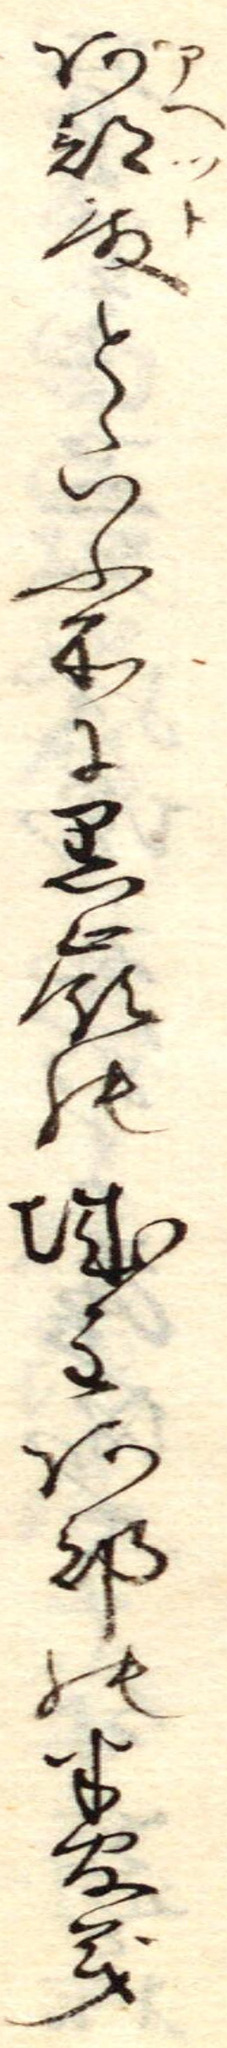阿部殿といふ所に黒嶺の城主阿部の判官義
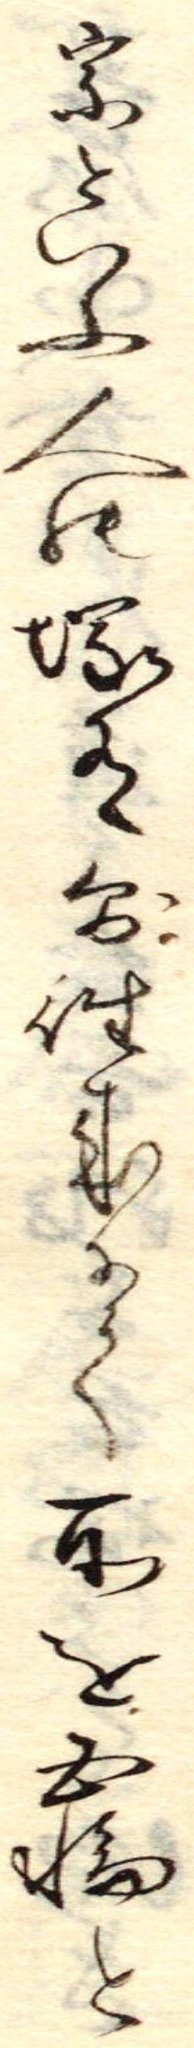宗といふ人の塚有則往生にて所を五輪と
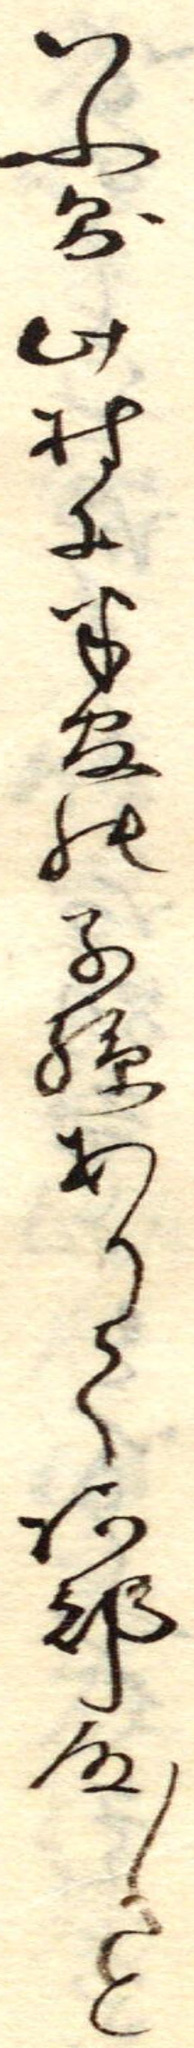いふ則此村に判官の子孫ありて阿部殿〳〵と

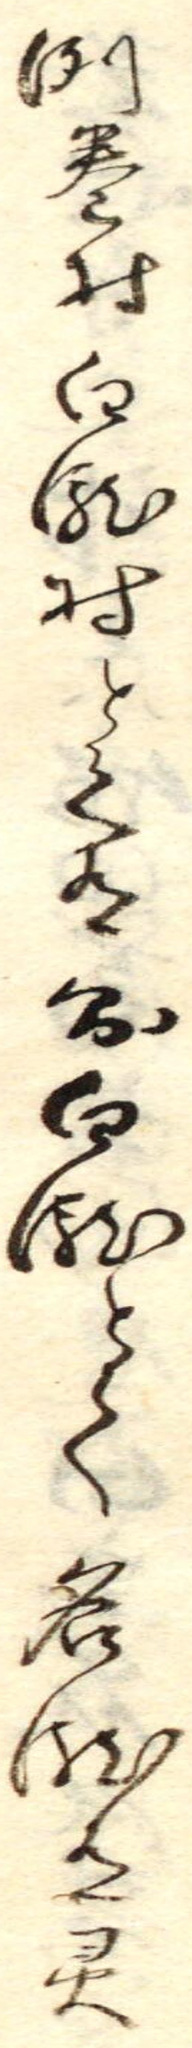洲巻村白瀧村とて有則白瀧とて名瀧有霊
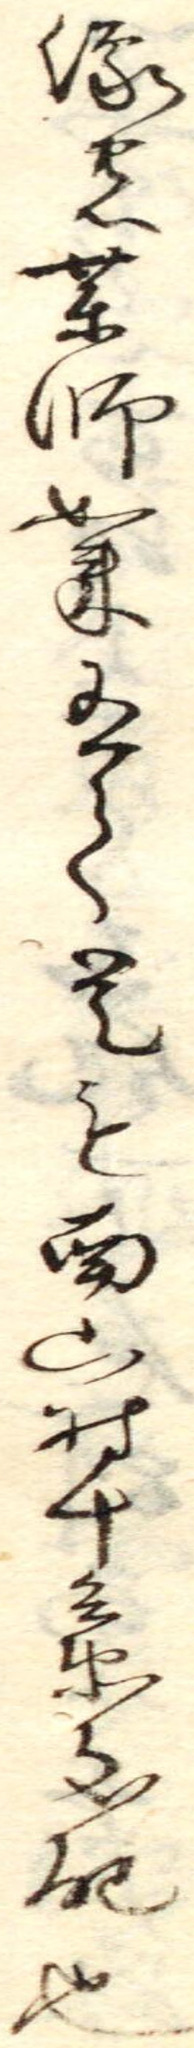像の薬師如来有て是も南山村十兵衛支配也
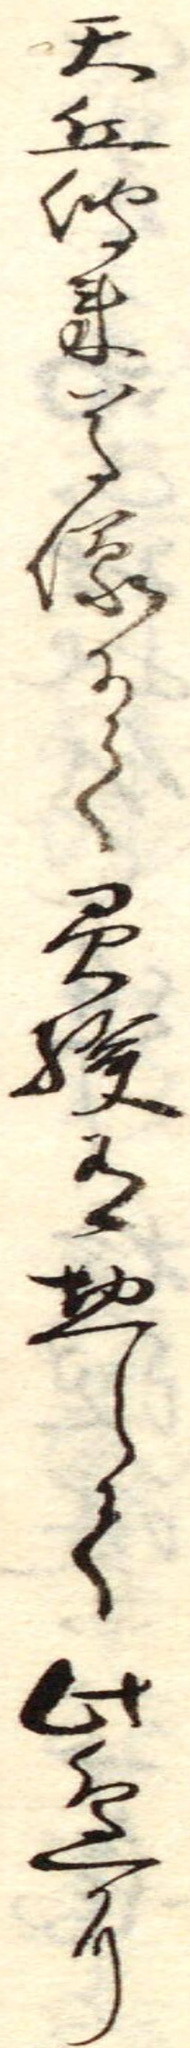天丘伝来尊像にて霊験有惣して此辺に
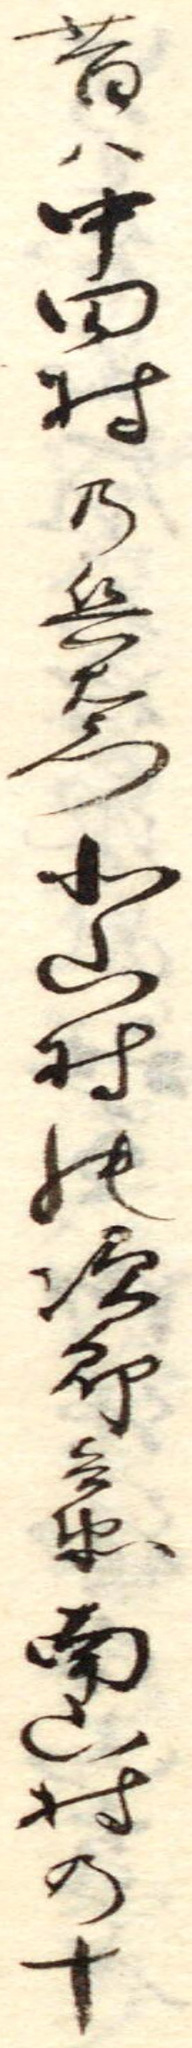昔は中田村の兵右衛門北山村の次郎兵衛南山村の十
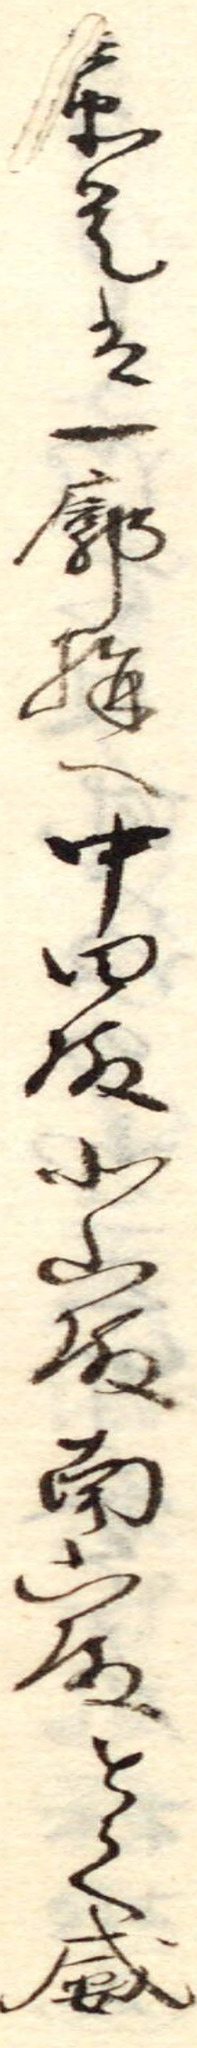兵衛是は一廓構へな中田殿北山殿南山殿とて威
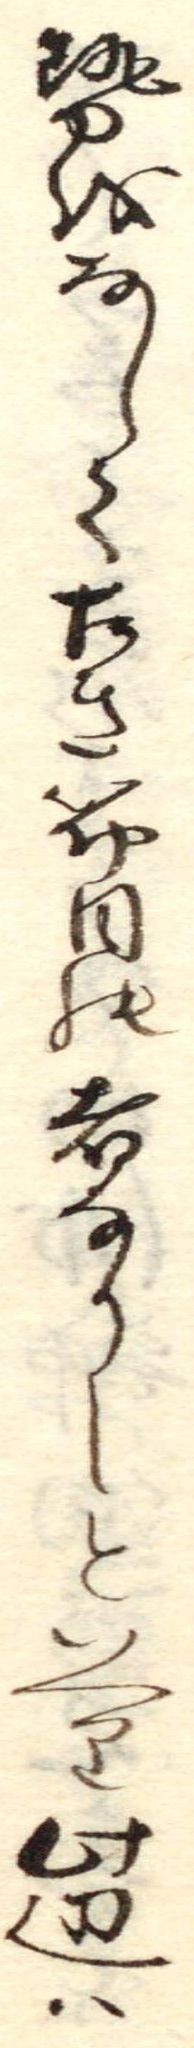勢をなして古き筋目の者なりしといへり此辺は
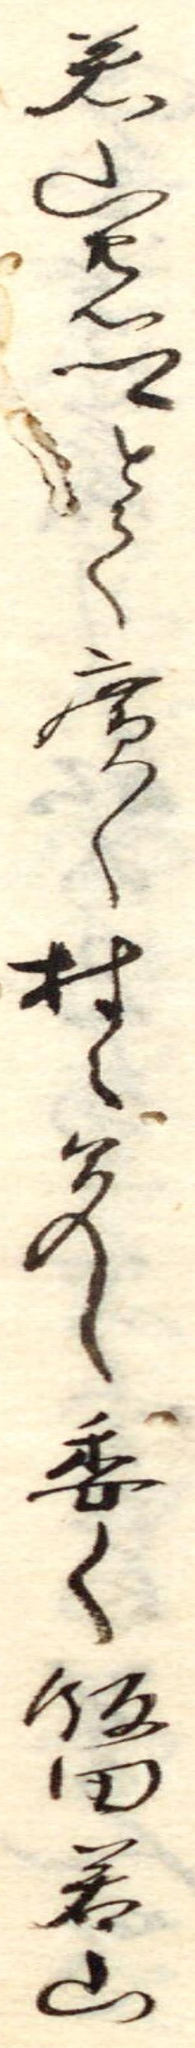若山の郷とて広く村々多し委く飯田若山
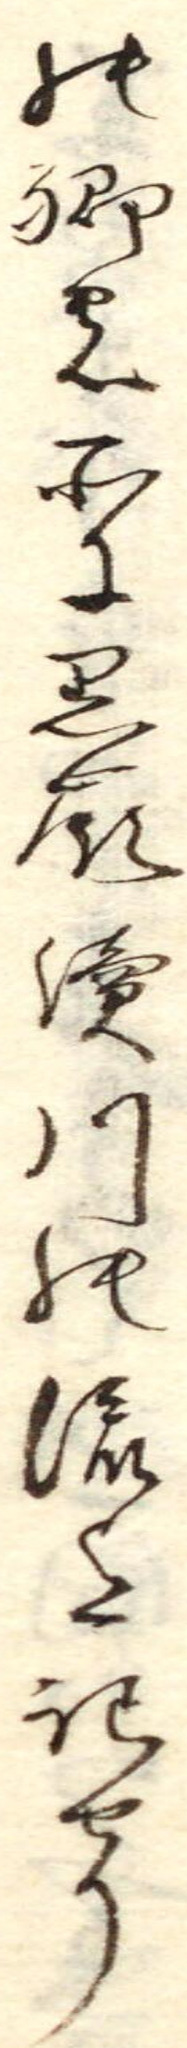の郷の所に黒嶺続川の流迄記せり
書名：能登名跡誌
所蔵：Ishikawa Prefectural Library
